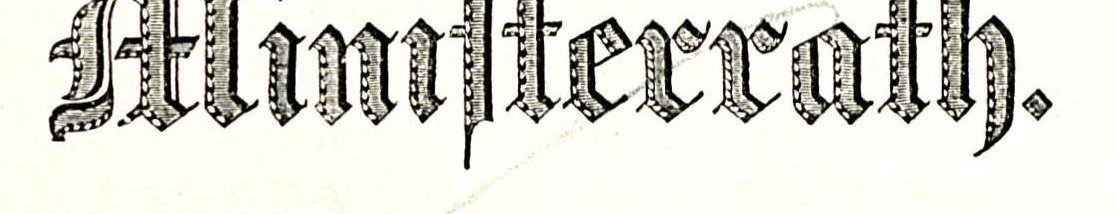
Ministerrath
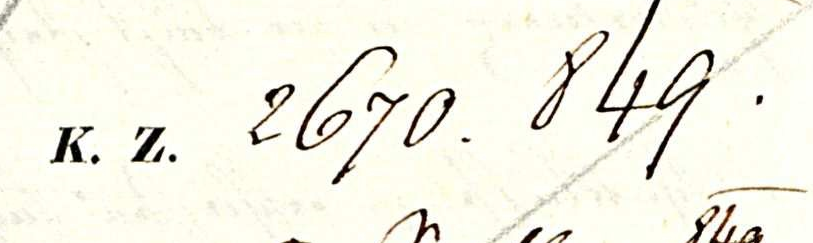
KZ 2670 [1]849
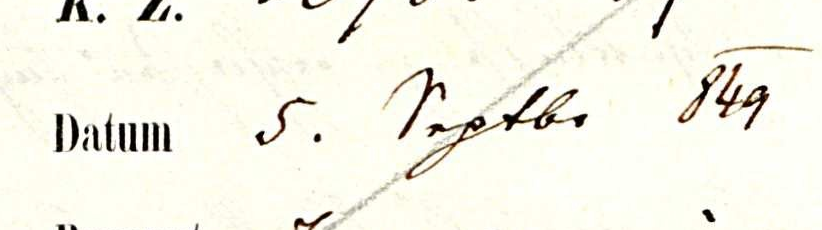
Datum 5. Septbr. 1849
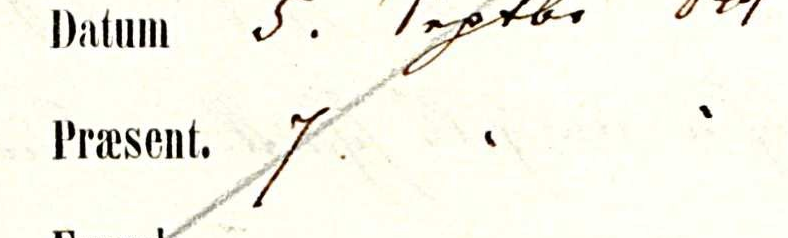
Praesent 7. „ „
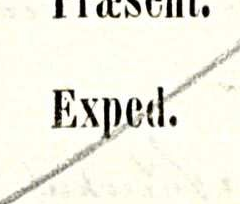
Exped.
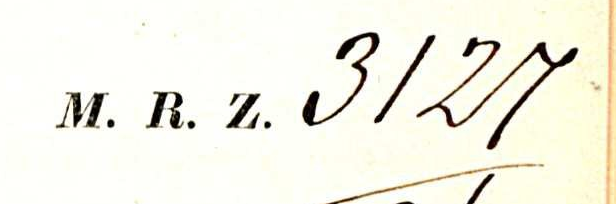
MRZ 3127/
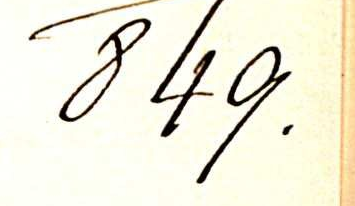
849
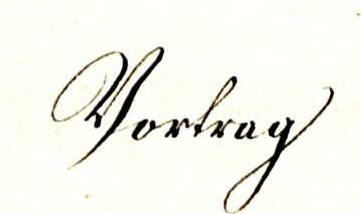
Vortrag
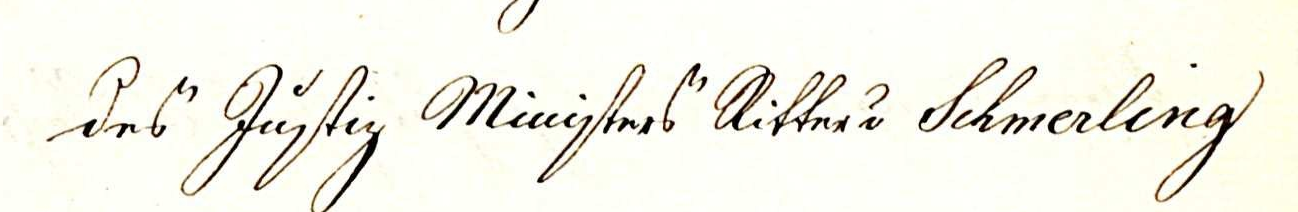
des Justiz-Ministers Ritter v. Schmerling
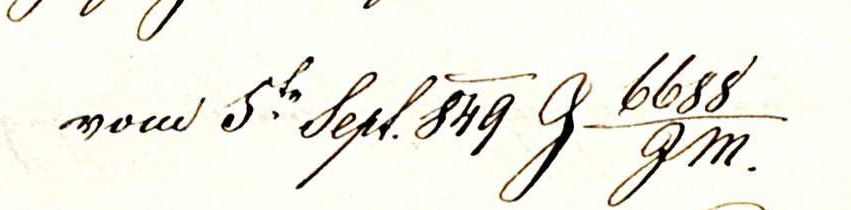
vom 5te Sept. 849 Z 6688/
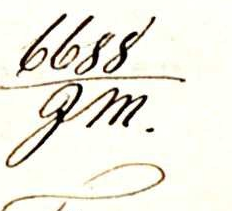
JM.
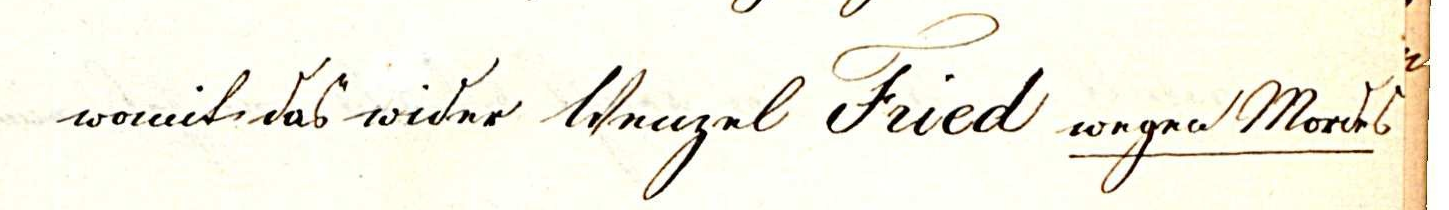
womit das wider Wenzel Fried wegen Mordes
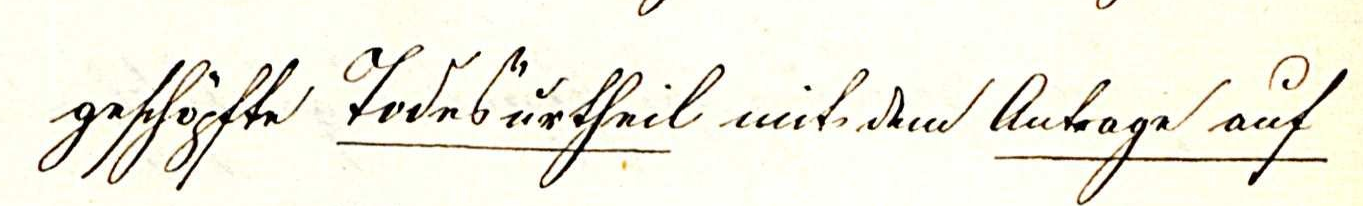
geschöpfte Todesurtheil mit dem Antrage auf
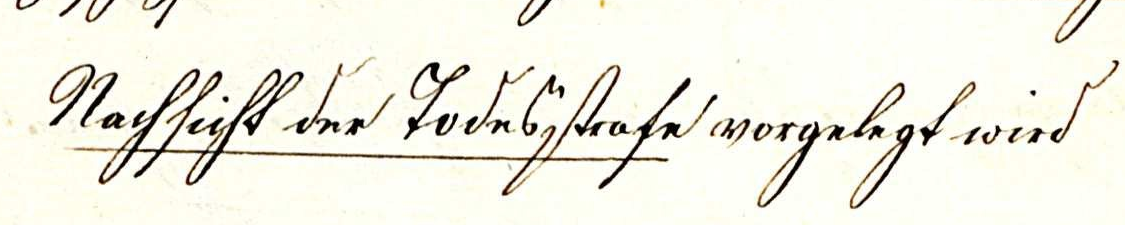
Nachsicht der Todesstrafe vorgelegt wird
